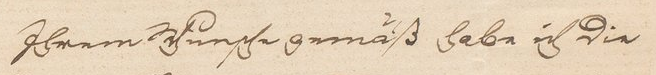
Ihrem Wunsche gemäß habe ich die
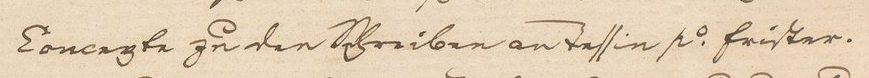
Concepte zu den Schreiben an Tessin po Frister-
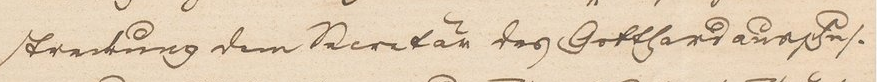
streckung dem Secretär des Gotthardausschus-
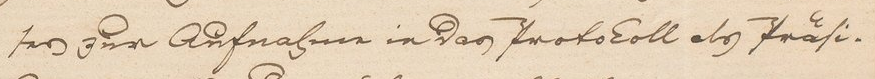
ses zur Aufnahme in das Protokoll als Präsi-
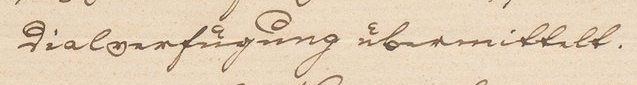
dialverfügung übermittelt.
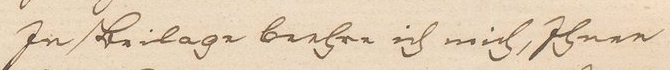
In Beilage beehre ich mich, Ihnen
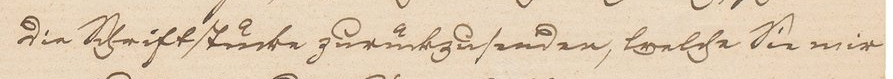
die Schriftstücke zurückzusenden, welche Sie mir
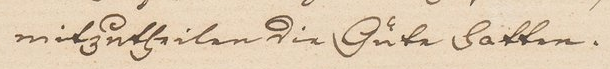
mitzutheilen die Güte hatten.
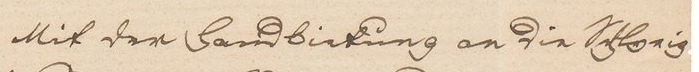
Mit der Handbietung an die Schweiz.
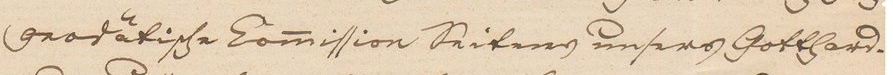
geodätische Commission Seitens unsers Gotthard -
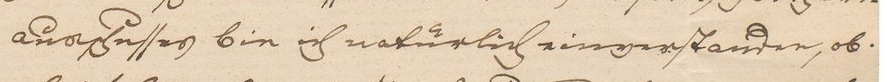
ausschusses bin ich natürlich einverstanden, ob-
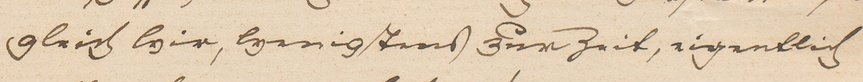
gleich wir, wenigstens zur Zeit, eigentlich
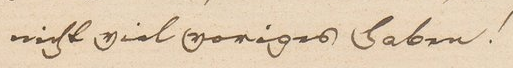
nicht viel voriges haben!
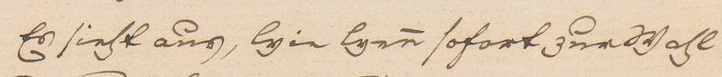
Es sieht aus, wie wenn sofort zur Wahl
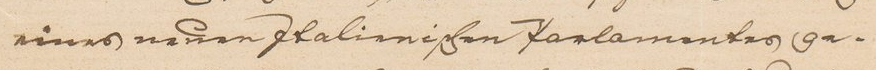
eines neuen Italienischen Parlamentes ge-
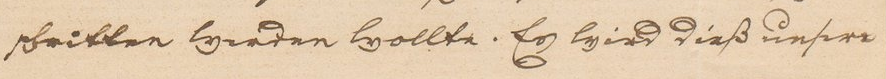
schritten werden wollte. Es wird dieß unsere
